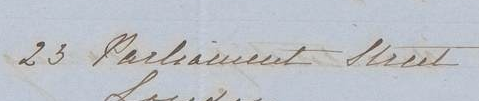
23 Parliament Street
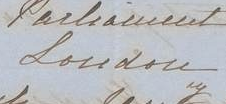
London
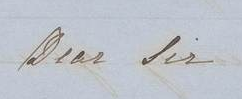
Dear Sir
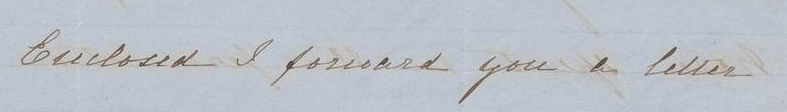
Enclosed I forward you a letter
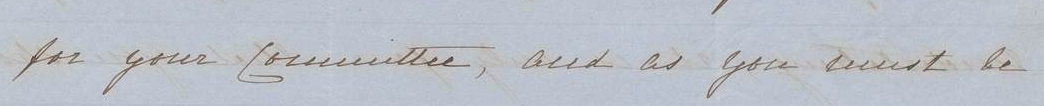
for your Committee, and as you must be
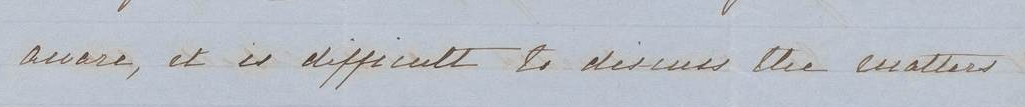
aware, it is difficult to discuss the matters
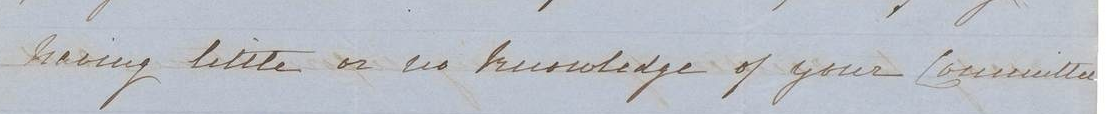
having little or no knowledge of your Committee
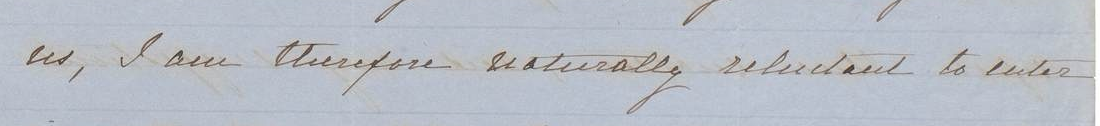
us, I am therefore naturally reluctant to enter
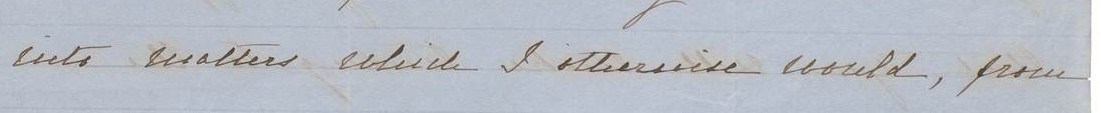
into matters which I otherwise would, from
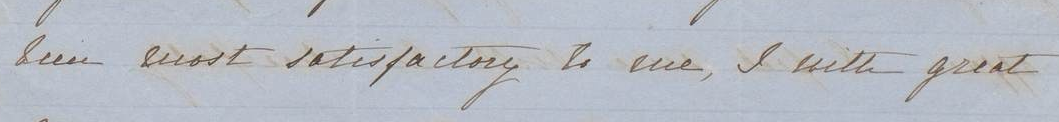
been most satisfactory to me, I with great
